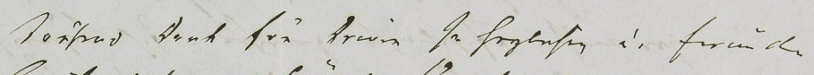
Tausend Dank für Deinen so herzlichen u. freund-
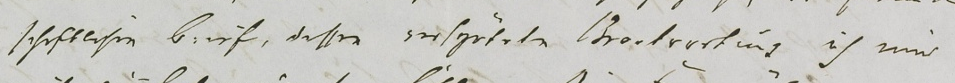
schaftlichen Brief, dessen verspätete Beantwortung ich mir
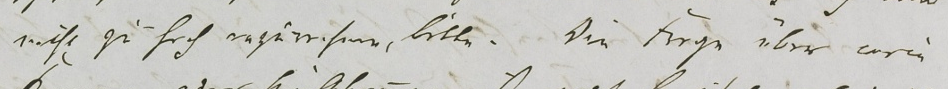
nicht zu hoch anzurechnen, bitte. Die Frage über mein
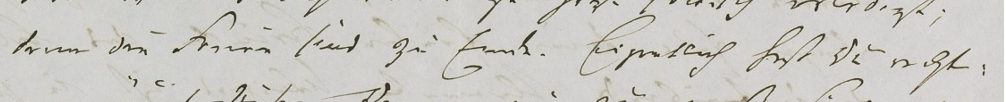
denn die Ferien sind zu Ende. Eigentlich hast Du recht:
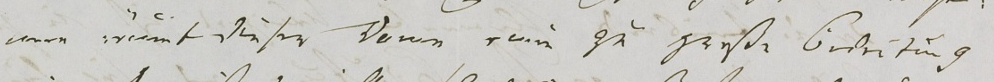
man räumt dieser Dame eine zu große Bedeutung
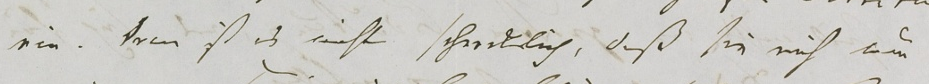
ein. Denn ist es nicht schrecklich, daß sie mich um
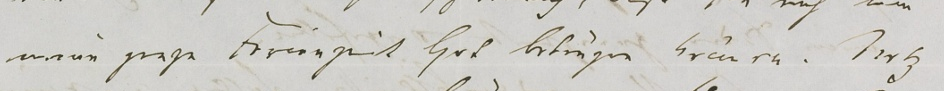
meine ganze Ferienzeit hat betrügen können. Trotz
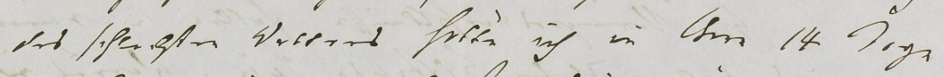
des schlechten Wetters hätte ich in Bern 14 Tage
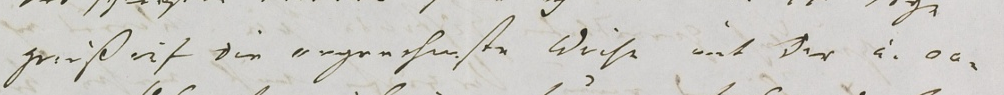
gewiß auf die angenehmste Weise mit Dir u. an-
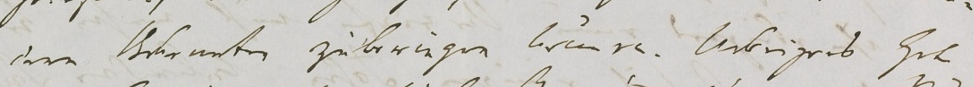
dern Bekannten zubringen können. Uebrigens hat
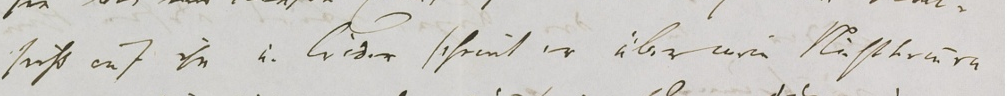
sicht auf ihn u. leider scheint er über mein Nichtkommen
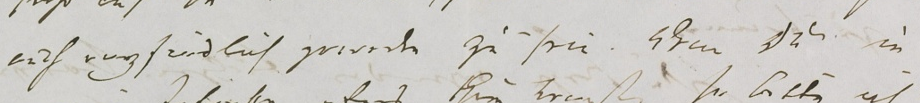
auch erzfeindlich geworden zu sein. Wenn Du in
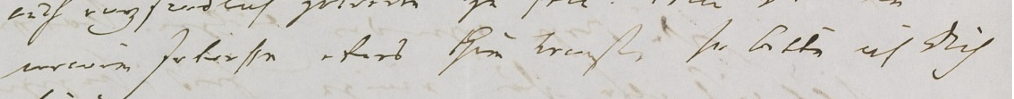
meinem Intresse etwas thun kannst, so bitte ich Dich
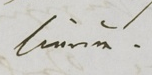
hierum.
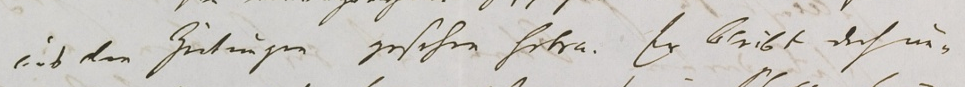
aus den Zeitungen gesehen haben. Er bleibt doch un-
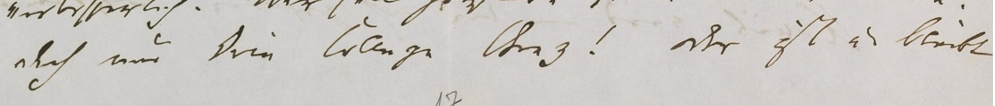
Doch nur Dein College Benz! Der ist u. bleibt
